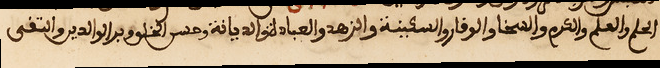الحلم والعلم والكرم والسخا والوقار والسكينة والزهد والعبادة والديانة وحسن الخلق وبر الوالدين والتقى
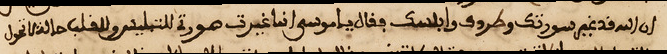ان الله قد غير سورتك وطردك وابلسك فقال يا موسى انما غيرت صورتى للتبليس وللقلب حالة لا تحول
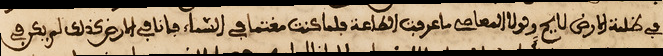في ظلمة الارض لايح ولو لا المعاصى ما عرفت الطاعة فلما كنت مغتما في السماء فانا في الارض كذلك لم يكن في
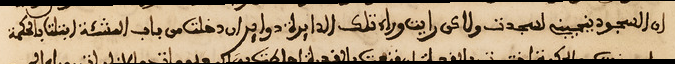ان السجود ينجيني لسجدت ولاكن رايت وراء تلك الدائرة دوائر ان دخلت من باب المشئة ابتلت بالحكمة
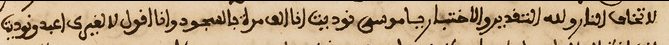لا تخاف النار ولله التقدير والاختبار يا موسى نوديت انا الف مرة بالسجود وانا اقول لا لغيرى اعبد ونوديت
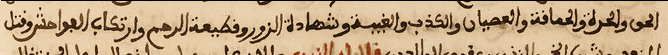الحق والحدة والحماقة والعصيان والكذب والغيبة وشهادة الزور وقطيعة الرحم وارتكاب الفواحش وقتل
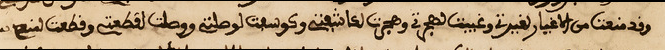وقد منعت من الاغيار لغيرتي وغييت لهجرتي وهجرت لكاشفتى وكوسفت لوصلتى ووصلت لقطعتى وقطعت لمنعي به
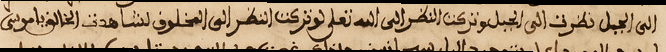الى الجبل نظرت الى الجبل وتركت النظر الى الله تعلى لو تركت النظر الى المخلوق لشاهدت الخالق يا موسى
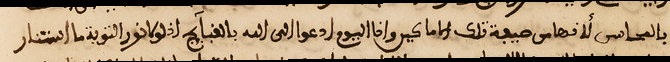بالمحاسن لأنها من صيفة تلك الاماكين وانا اليوم ادعوا الى الله بالقبائج اذ لو لا نور التوبة استنار
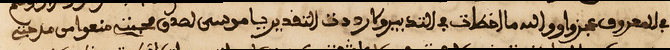في المعروف عجزوا ووالله ما اخطات في التدبير ولا رددت التقدير يا موسى لصدق محبتى منعوا من مدجتى
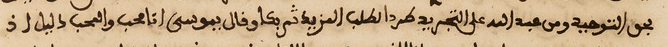بحق التوحيد ومن عبد الله على التجريد طردا لطلب المزيد ثم بكا وقال يموسى انا محب والمحب دليل اذ
